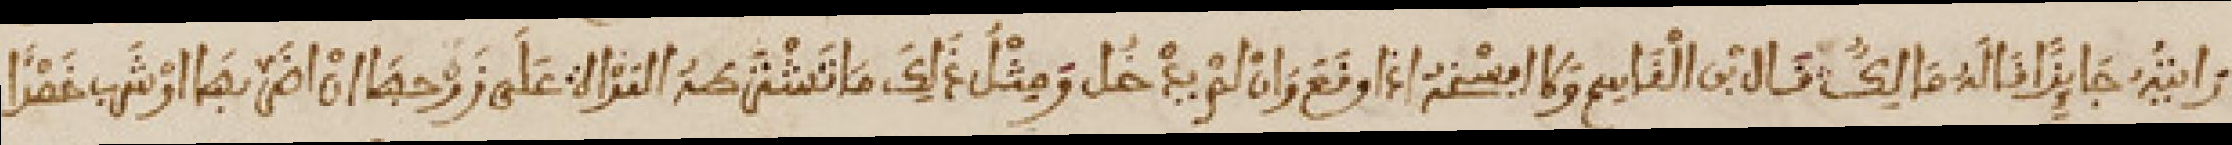رايته جائزا قاله مالك قال بن القاسم ولا افسخه اذا وقع وان لم يدخل ومثل ذلك ما تشترطه المراة على زوجها ان اضر بها او شرب خمرا
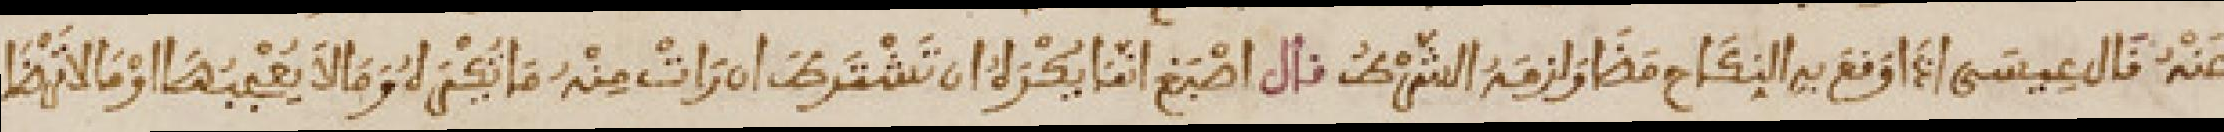عنه قال عيسى اذا وقع به النكاح مضا ولزمه الشرط قال اصبغ انما يكره ان تشترط ان رات منه ما تكره وما لا يعجبها اوما لا ترضا
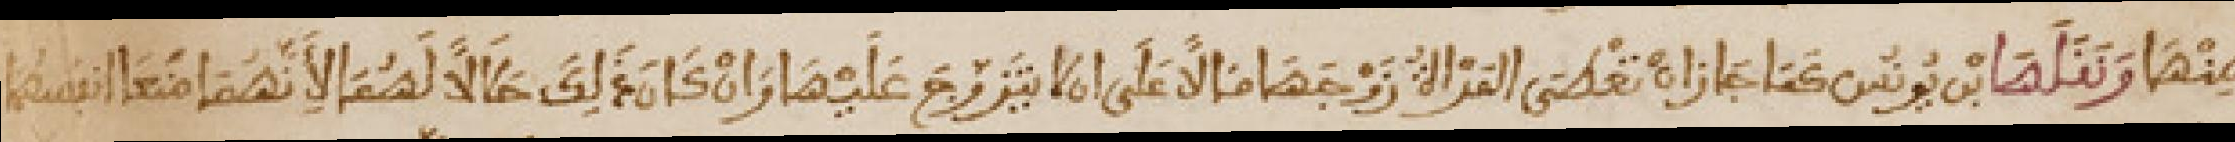منها ونقلها بن يونس كما جاز ان تعطى المراة زوجها مالا على ان لا يتزوج عليها وان كان ذلك حلالا لهما لأنهما منعا انفسهما
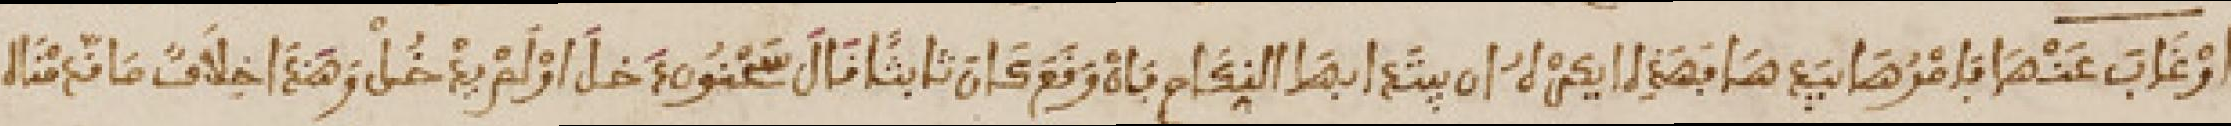او غاب عنها فامرها بيدها فهذه ايكره أن يبتدا بها النكاح فان وقع كان ثابتا قال سحنون دخل او لم يدخل وهذا خلاف ما قدمناه
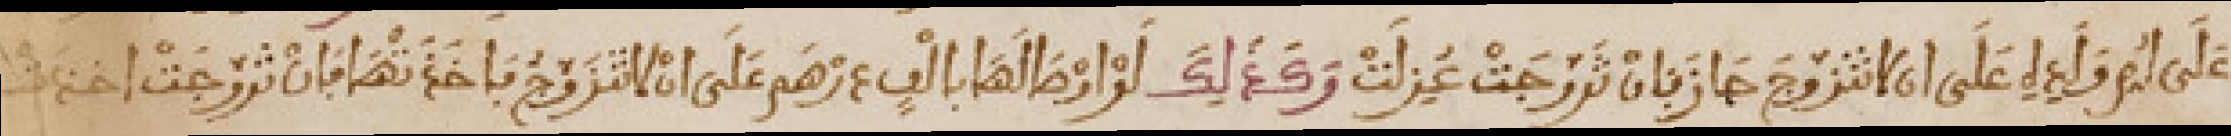على ام ولده على ان لا تتزوج جاز فان تزوجت عزلت وكذلك لو اوصا لها بالف درهم على ان لا تتزوج فأخاتها فان تزوجت اخذت
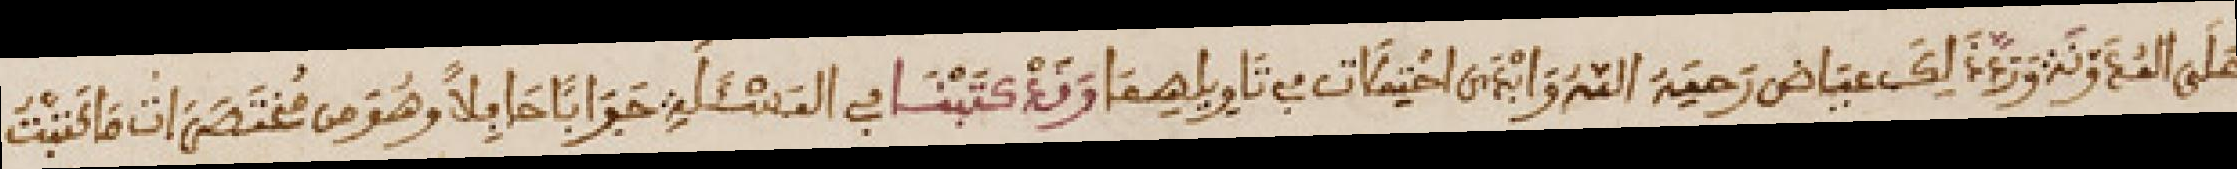على المدونة ورد ذلك عياض رحمه الله وابدى احتمالات في تاويلهما وقد كتبنا في المسئلة جوابا حافلا وهو من مختصرات ما كتبت
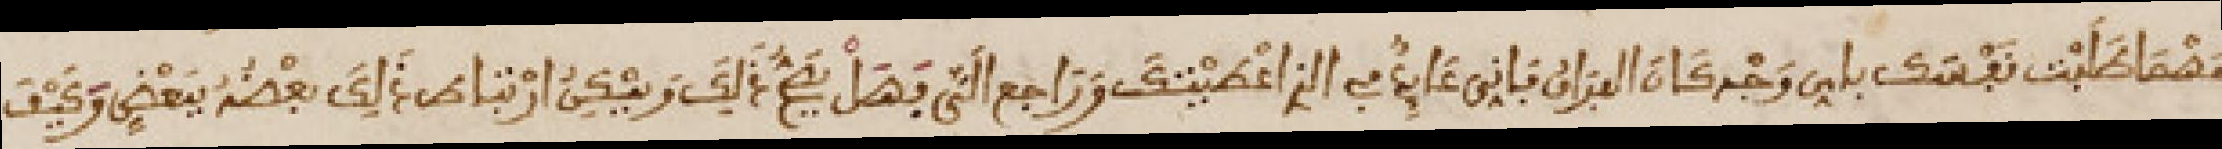مهما طلبت نفسك باي وجه كان الفراق فإني عائد في الذي أعطيتك وراجع الي فهل يصح ذلك ويمكن ارتباط ذلك بعضه ببعض وكيف
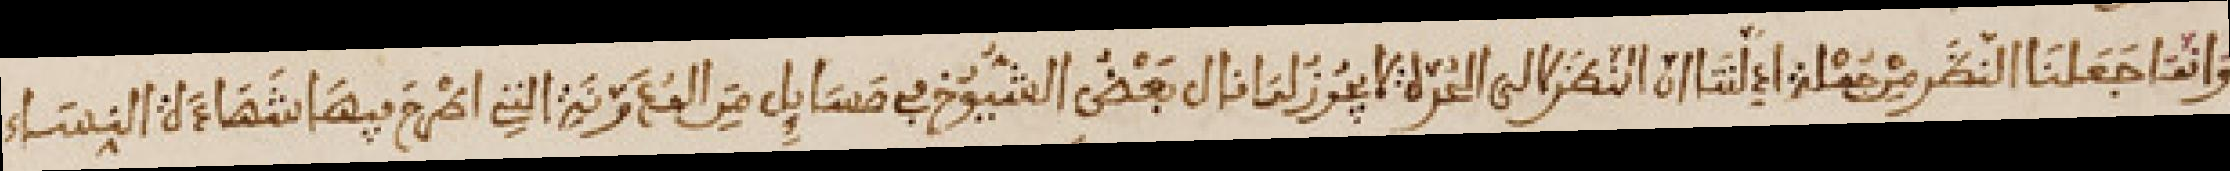وانما جعلنا النظر من جملة ادلتنا ان النظر لالى الحرة لا يجوز لما قال بعض الشيوخ في مسائل من المدونة التي اطرح فيها شهادة النساء
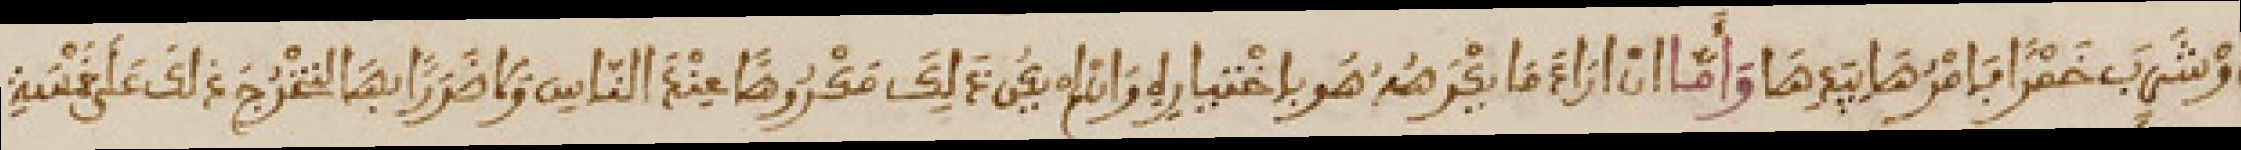او شرب خمرا فامرها بيدها وأما ان اراد ما يكرهه هو باختياره وان لم يكن ذلك مكروها عند الناس ولا ضررا بها لتخرج على خمسة
